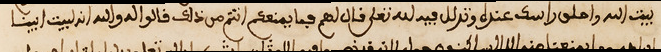بيت الله واحلق راسك عنده وتدلل فيه لله تعلى قال لهم فما يمنعكم انتم من ذلك قالوا له والله انه لبيت ابينا
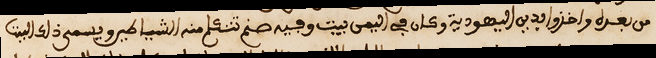من بعده واخذوا بدين اليهودية وكان في اليمن بيت وفيه صنم تتكلم منه الشياطين ويسمى ذلك البيت
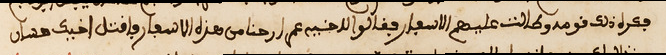فكره ذلك قومه وطالت عليهم الاسفار فقالوا لاخيه عمر ارحنا من هذه الاسفار فاقتل اخيك حسان
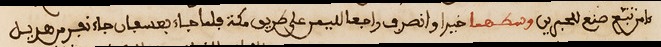ءامن تبّع صنع للحبرين وسطهما خيرا وانصرف راجعا لليمن على طريق مكة فلما جاء بعسفان جاء نفر من هديل
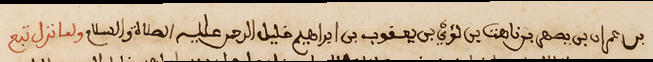بن عمران بن يصهر بن ناهت بن لؤي بن يعقوب بن ابراهيم خليل الرحمن عليه الصلاة والسلام ولما نزل تبع
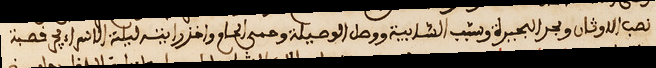نصب الاوثان وبحر البحيرة وسبّب السّايبة ووصل الوصيلة وحمى الحام واخذ رايته ليلة الاسراء يجر قصبة
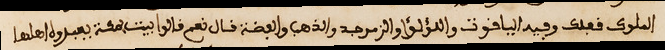الملوك قبلك وفيه الياقوت واللؤلؤ او الزمرجد والذهب والفضة قال نعم قالوا بيت بمكة يعبدوه اهلها
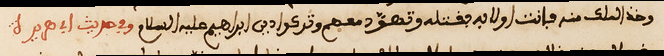وخذ الملك منه فانت اولا به فقتله وتهوّد معهم وتركوا دين ابراهيم عليه السلام وفي حديث ابي هريدة
